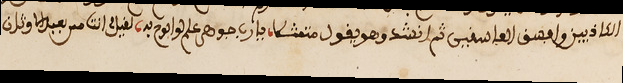الكذبين وافسق الفاسقين ثم انشد وهو يقول متمثلا يارب جوهر علم لو ابوح به لقيل لى انت ممن بعبد الاوثان
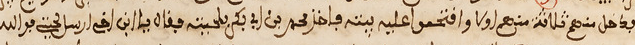فدخل منهم ثلاثة منهم اولا واقتحموا عليه بيته فاخذ محمد بن ابى بكر بلحيته فقال يا ابن اخى ارسل لحيتى فو الله
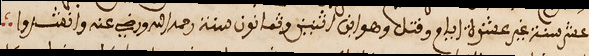عشر سنة غير عشرة ايام وقتل وهو ابن اثنين وثمانون سنة رحمه الله ورضي عنه وانشدوا
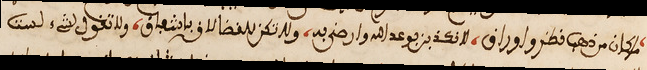ما كان من ذهب نظروا وراق لا نكذبن بوعد الله وارض به ولا تكن للقضا لاق باشفاق ولا تقول لشئ لست
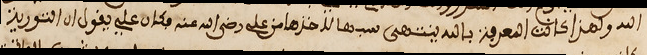الله ولهذا كانت المعرفة بالله ينتهى نسبها لاخذها من على رضى الله عنه فكان علي يقول ان التورية
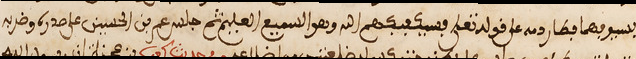بسيوفهما فطار دمه على قوله تعلى فسيكفيكهم الله وهو السميع العليم ثم جلس عمر بن الحسين على صدره وضربه
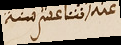عنه اثنا عشر سنة
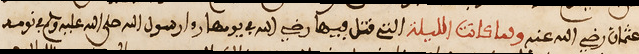عثمان رضي الله عنه ولما كانت الليلة التي قتل فيها رضي الله في يومها رءا رسول الله صلى الله عليه وسلم فو نومه
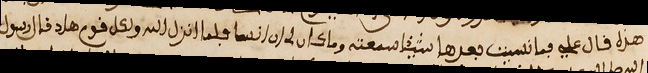هذه قال علي فما نسيت بعدها شيئا سمعته وما كان لى ان انسا فلما انزل الله ولكل قوم هاد قال رسول
